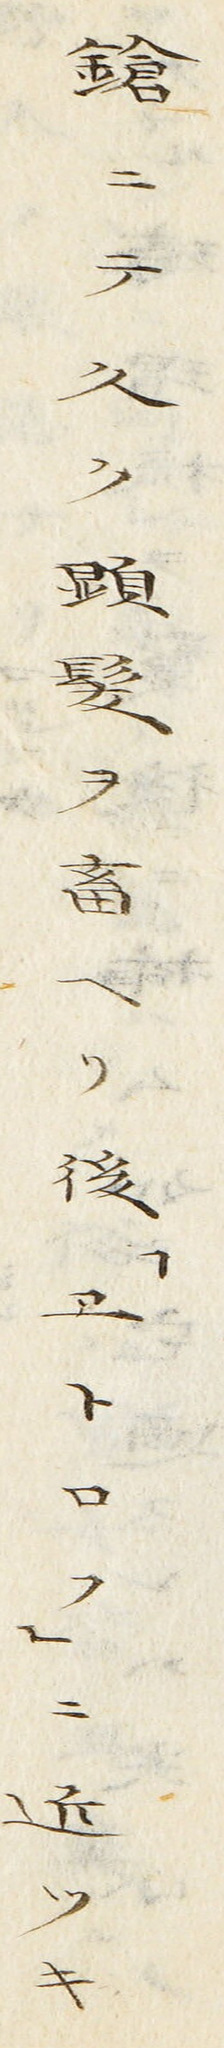鎗ニテ久ク顕髪ヲ畜ヘリ後「ヱトロフ」ニ近ツキ
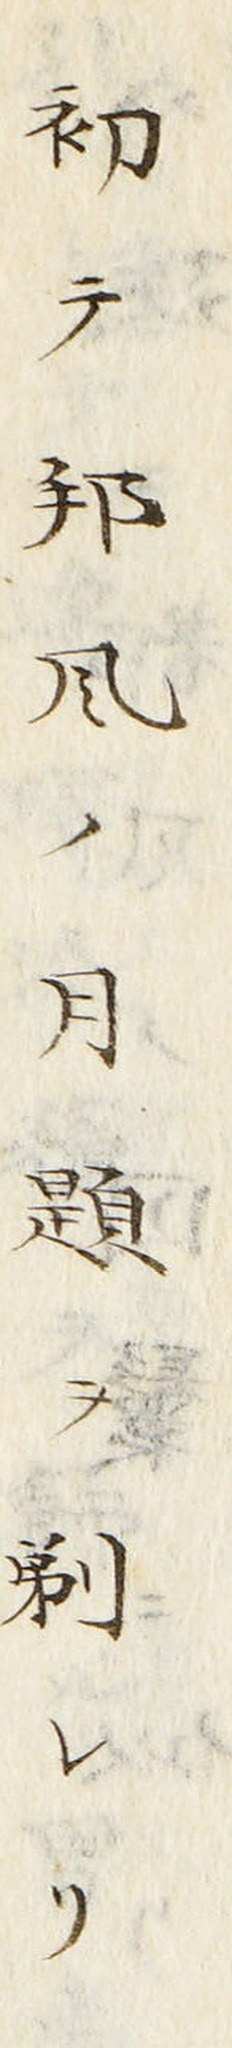初テ邦風ノ月題ヲ剃レリ
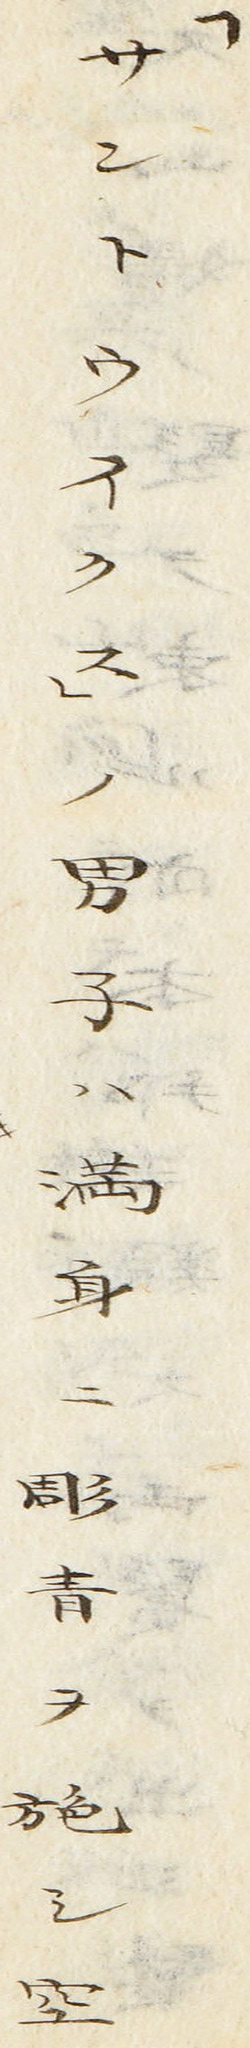〇「サントウイクス」ノ男子ハ満身ニ彫青ヲ施シ空
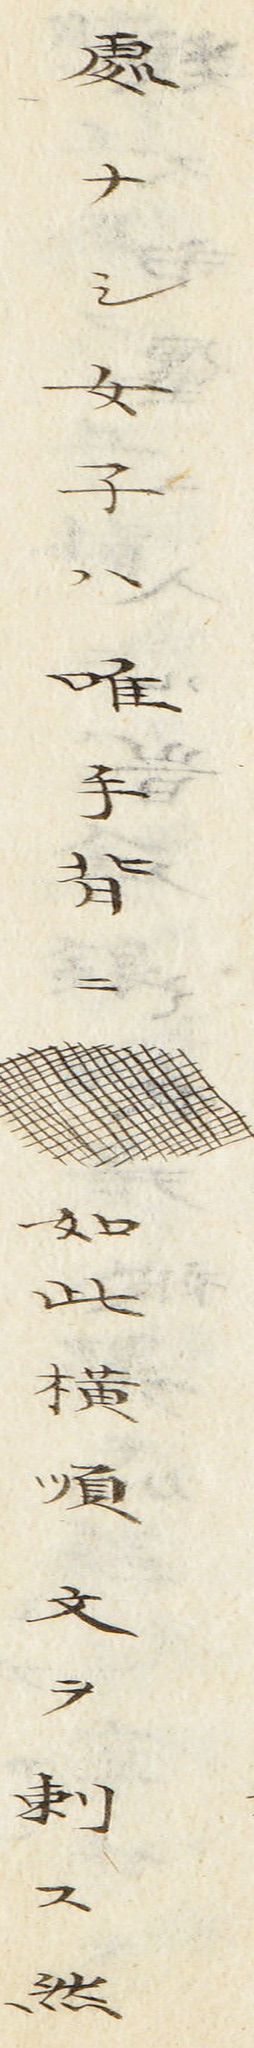所ナシ女子ハ唯手背ニ如此横順文ヲ刺ス然
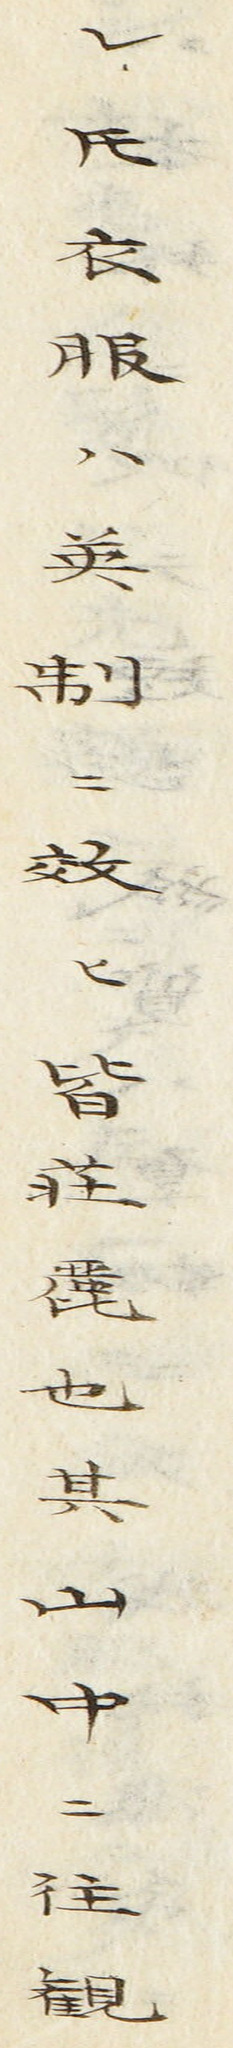レトモ衣服ハ英制ニ傚ヒ皆荘麗也其山中ニ往観
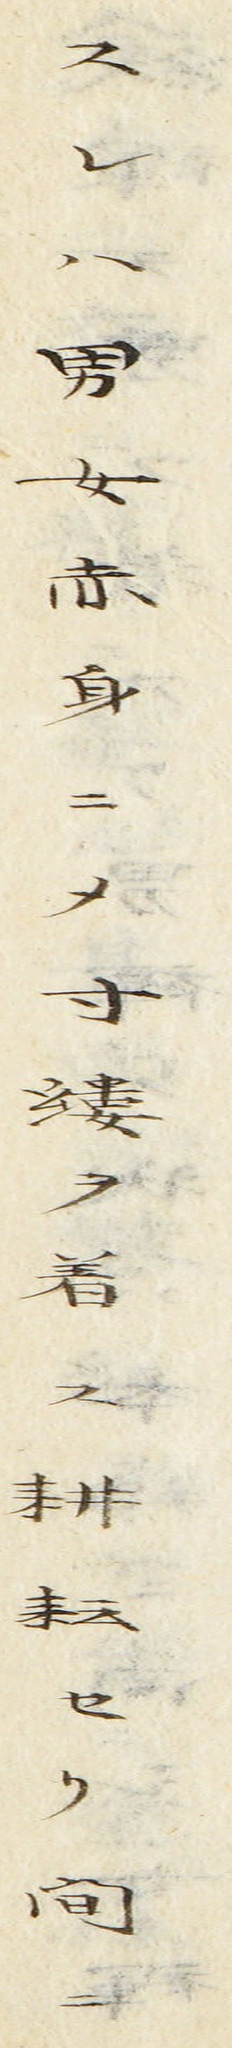スレハ男女赤身ニシテ寸縷ヲ着ス耕耘セリ間ニ

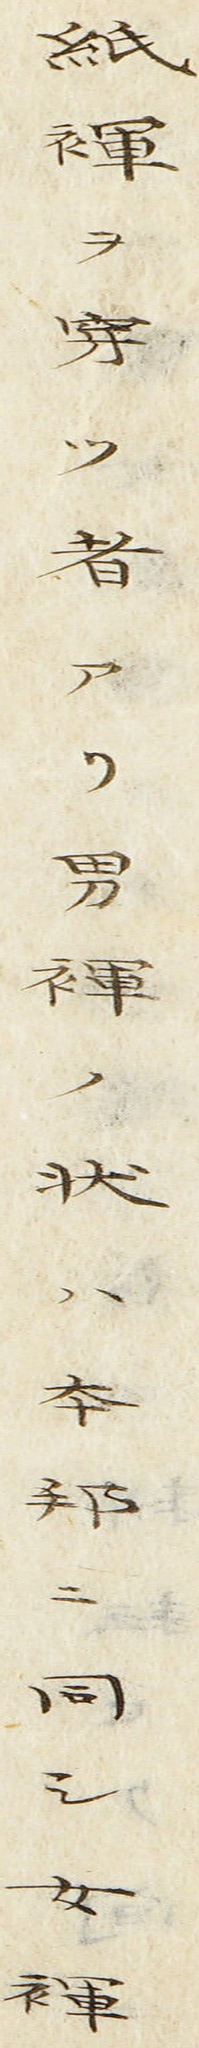紙褌ヲ穿ツ者アリ男褌ノ状ハ本邦ニ同シ女褌
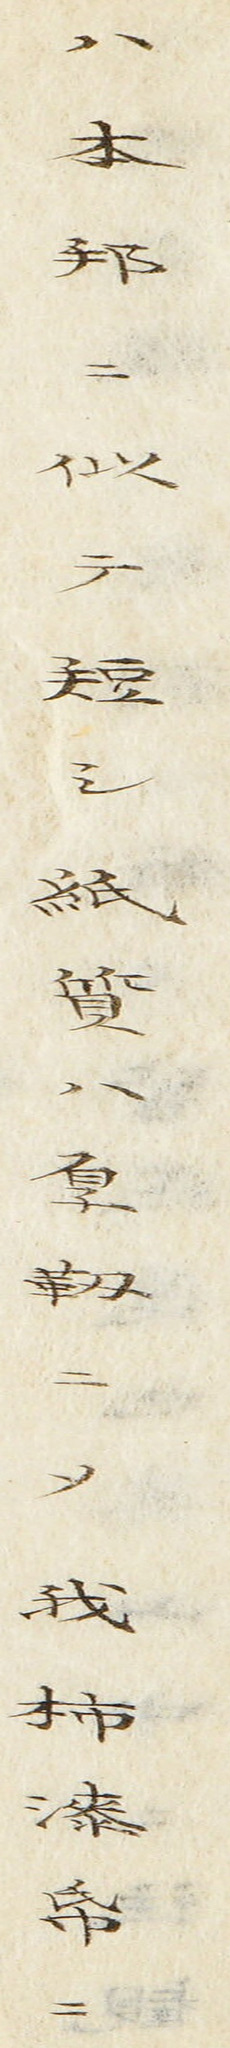ハ本邦ニ似テ短シ紙質ハ厚靭ニシテ我柿漆帋ニ
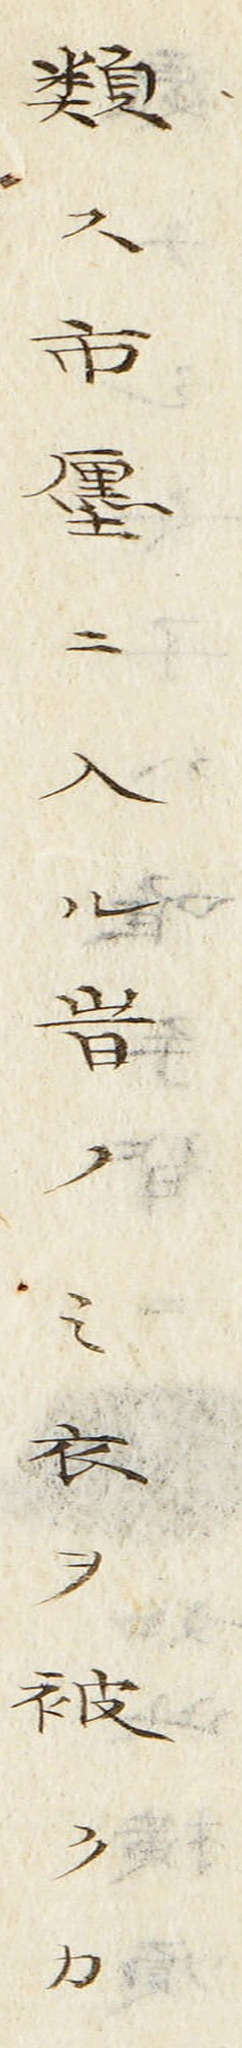類ス市㕓ニ入ル時ノミ衣ヲ被クカ
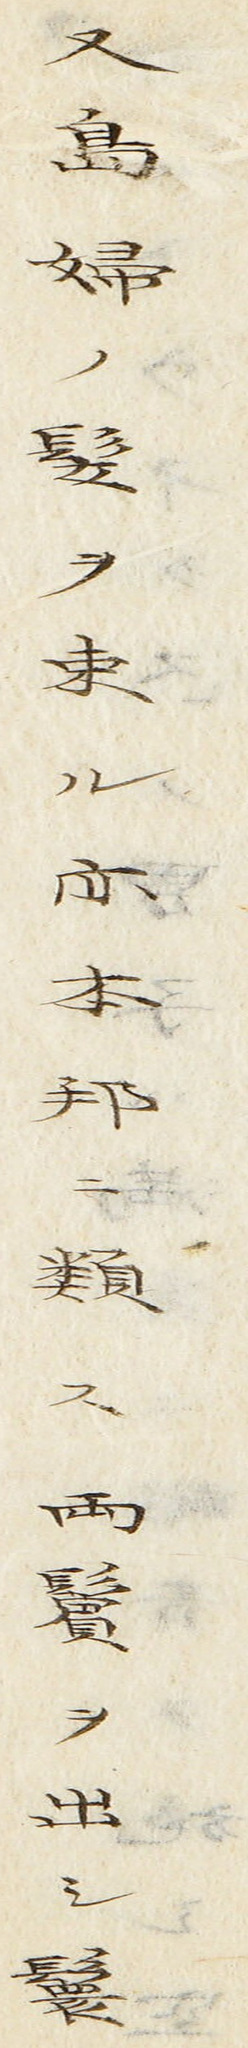〇又島婦ノ髪ヲ束ル亦本邦ニ類ス両鬢ヲ出シ鬟
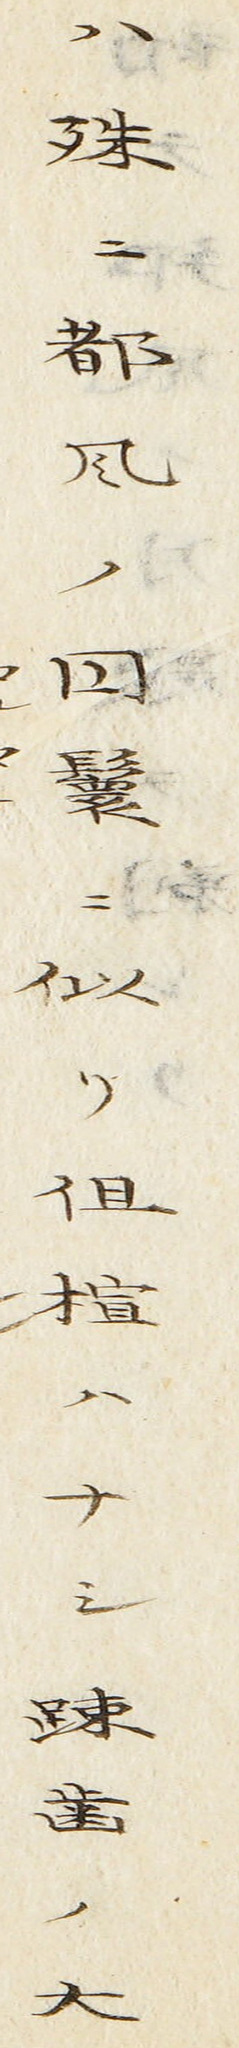ハ殊ニ都風ノ円鬟ニ似リ但楦ハナシ踈歯ノ大
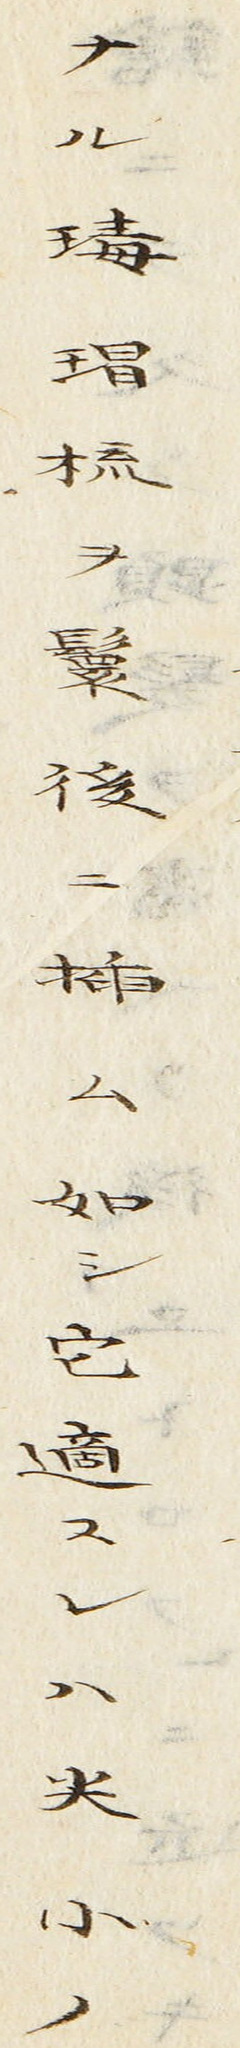ナル瑇瑁梳ヲ鬟後ニ挿ム如シ它適スレハ小ノ
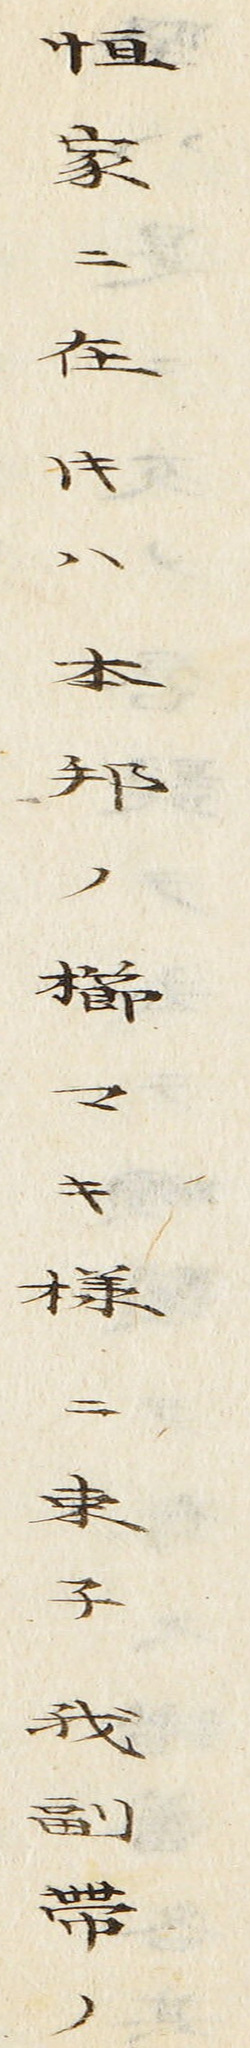恒家ニ財在トキハ本邦ノ櫛マキ様ニ束子我副帯ノ
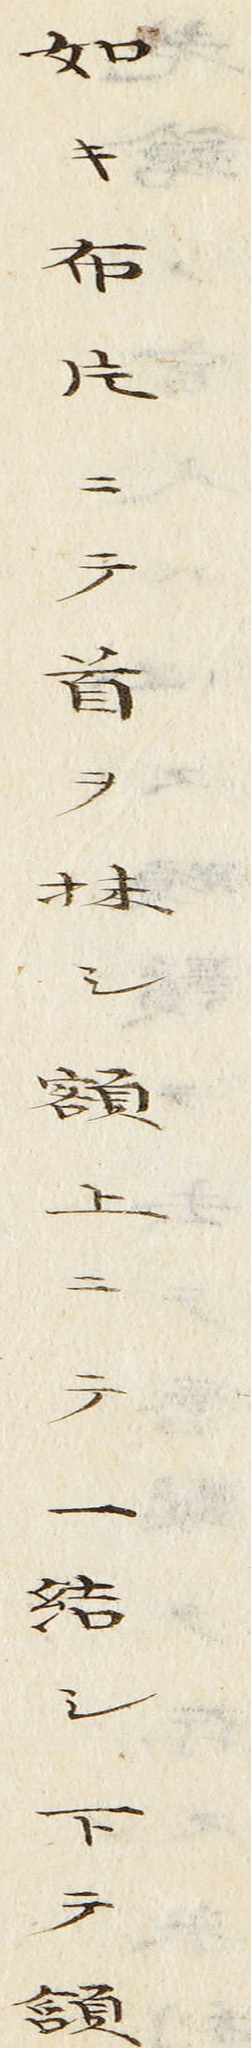如キ布片ニテ首ヲ抹シ額上ニテ一結シ下テ頷
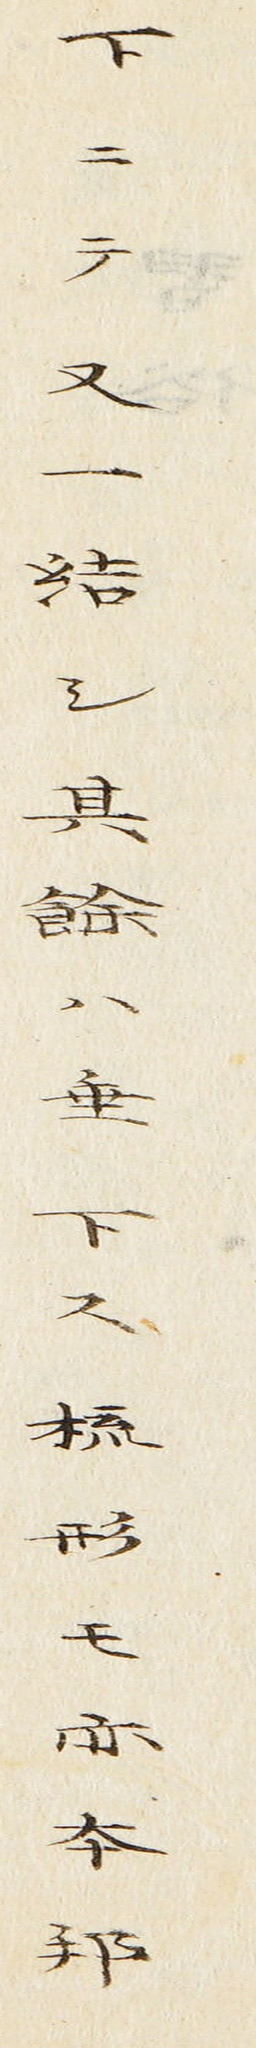下ニテ又一結シ其余ハ垂下ス梳形モ亦本邦ニ
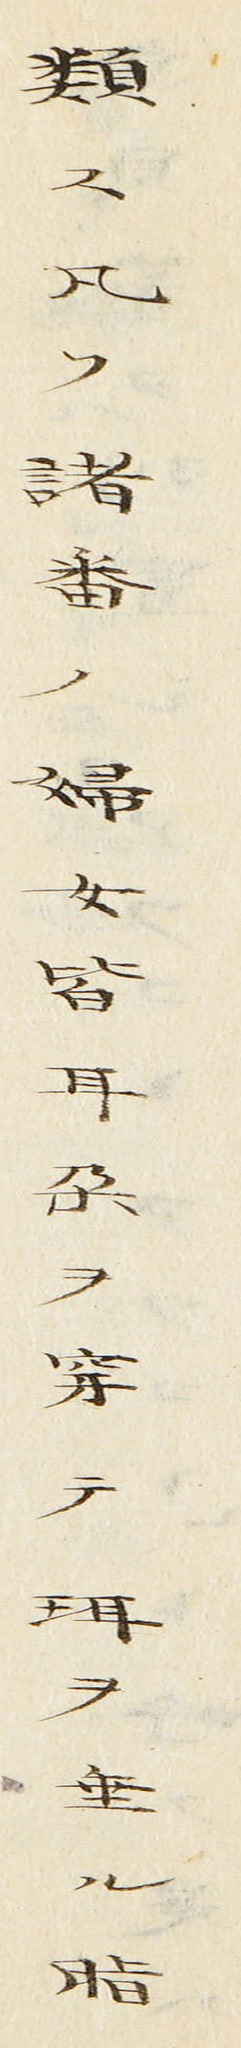類ス凡ソ諸番ノ婦女皆耳朶ヲ穿テ珥ヲ垂ル脂
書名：蕃談
